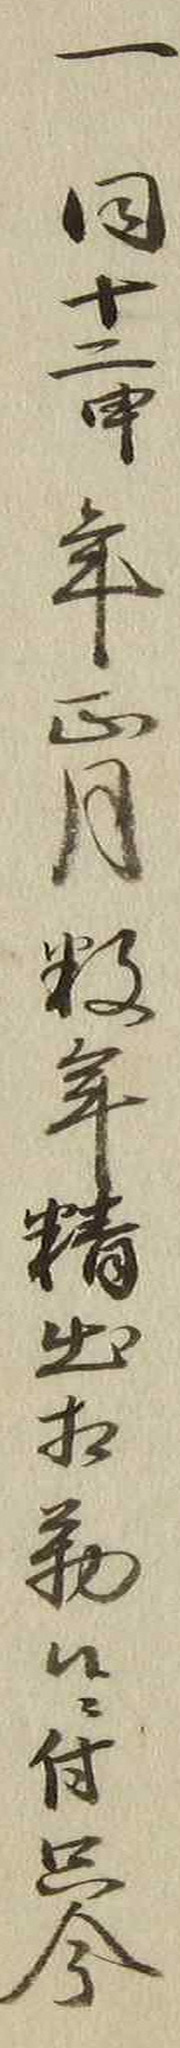一同十二申年正月数年精出相勤に付只今
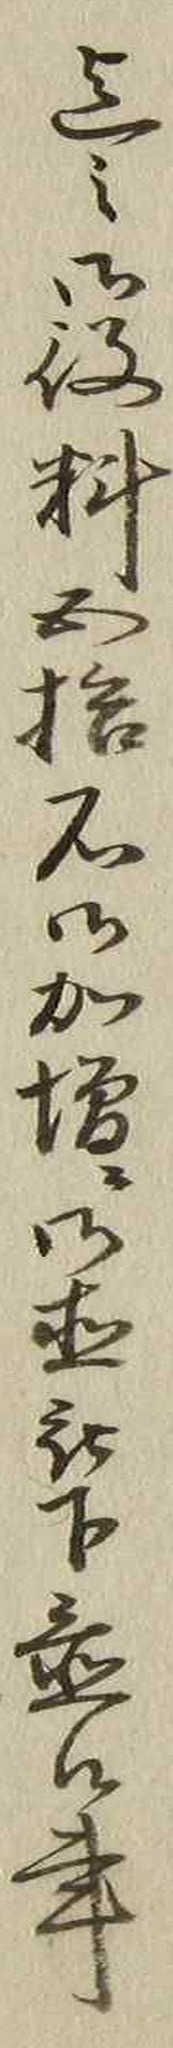迄之御役料五拾石御加増に御直被下置候事
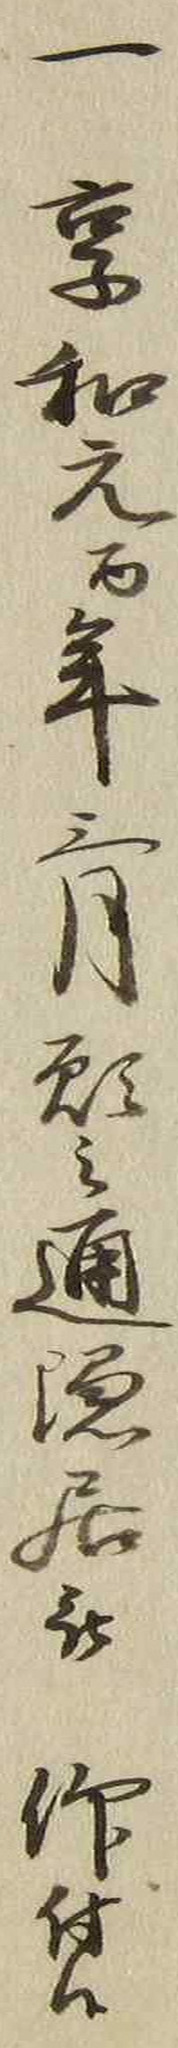一享和元酉年三月願之通隠居被仰付候
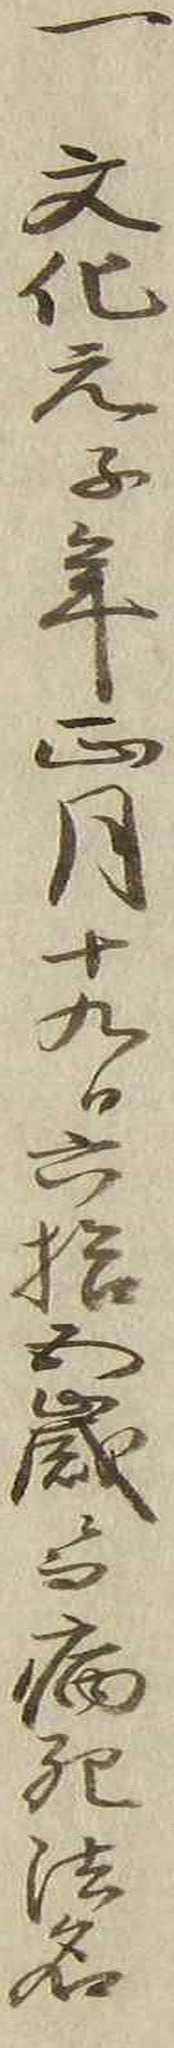一文化元子年正月十九日六拾五歳に而病死法名
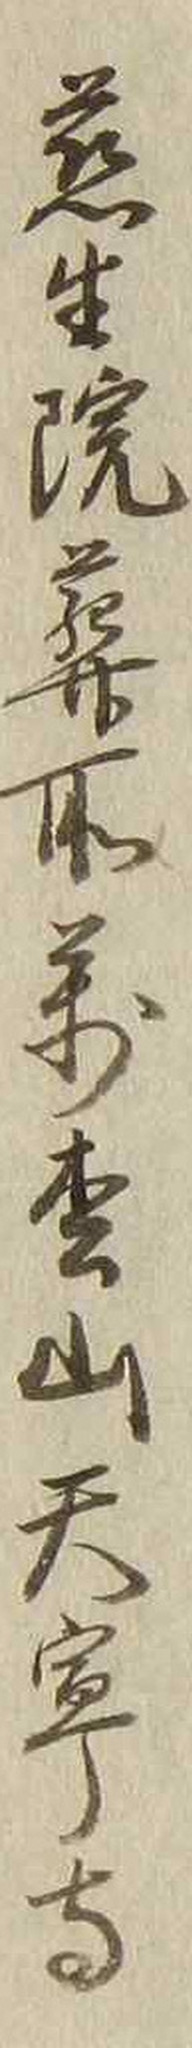慈生院葬所万松山天寧寺

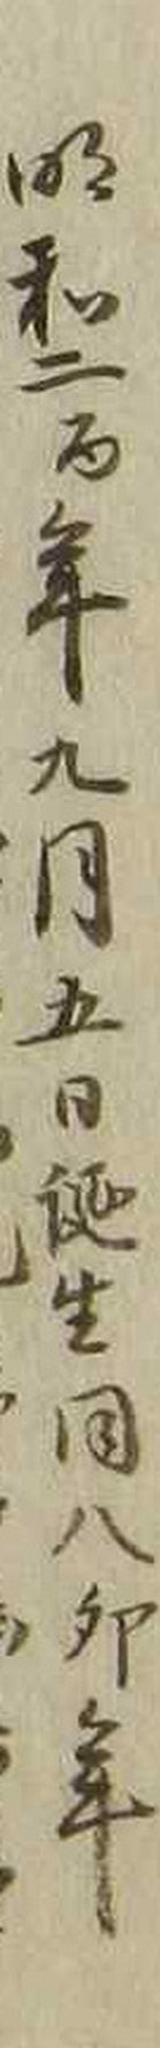輝明和二酉年九月五日誕生同八卯年
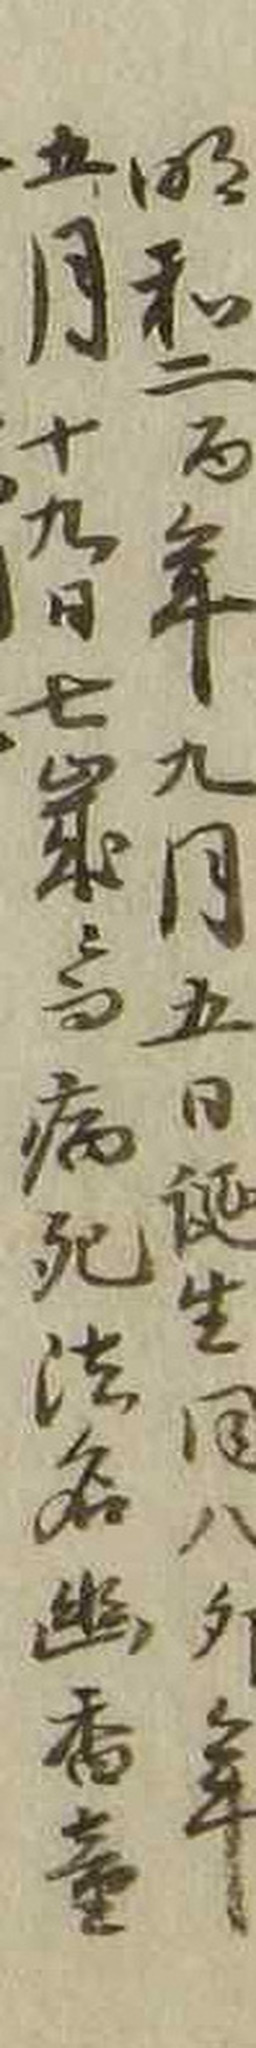女五月十九日七歳に而病死法名幽香童
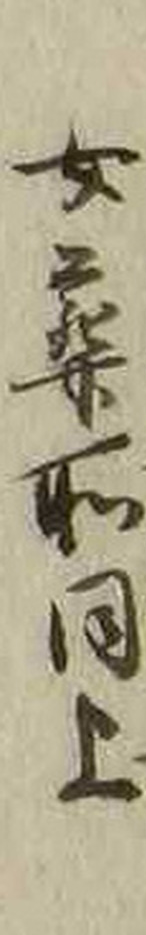女葬所同上
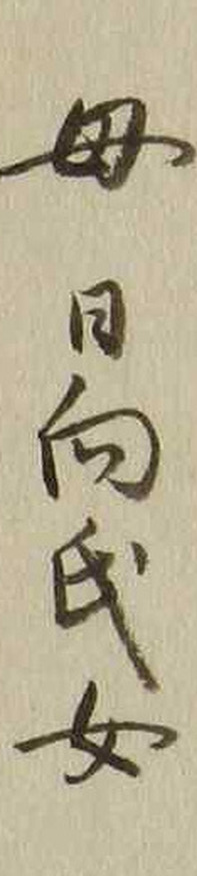母日向氏女
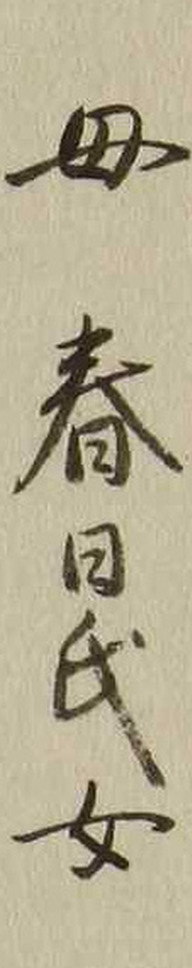母春日氏女
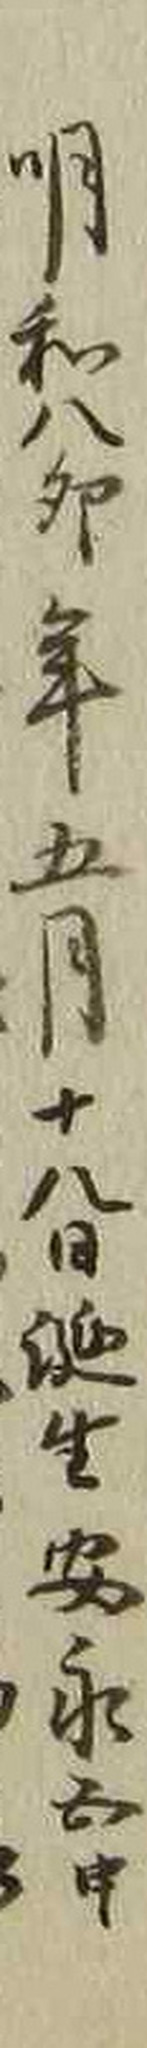明和八卯年五月十八日誕生安永五申
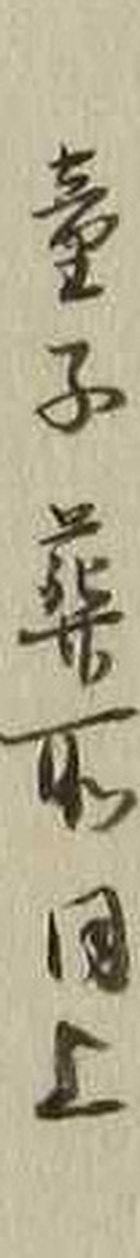童子葬所同上
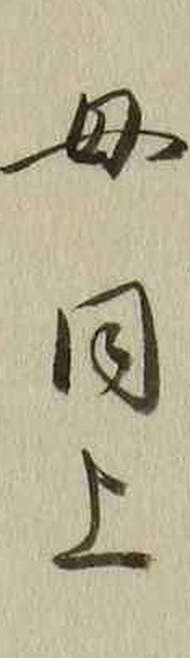母同上
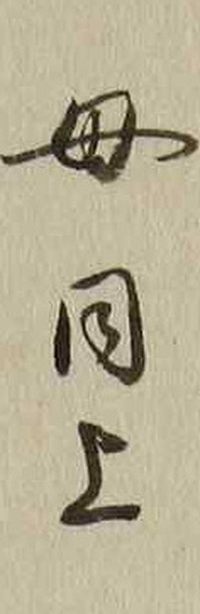母同上
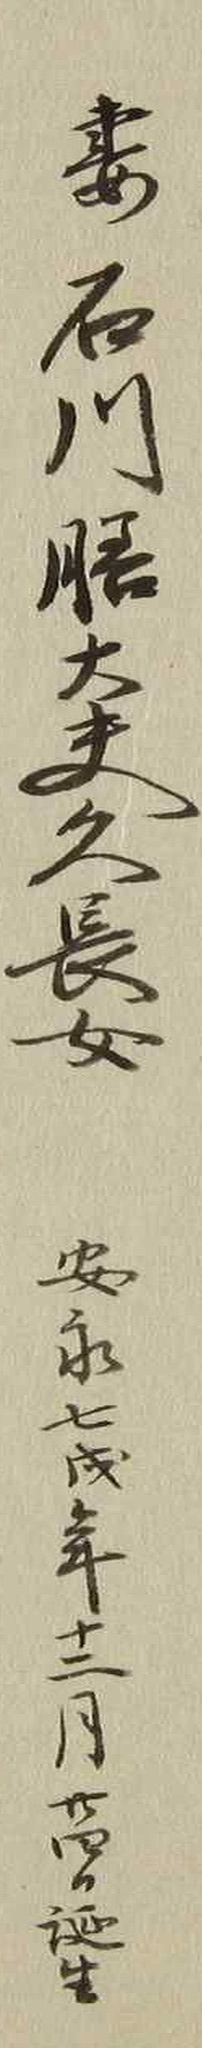妻石川膳大夫久長女安永七戌年十二月廿四日誕生
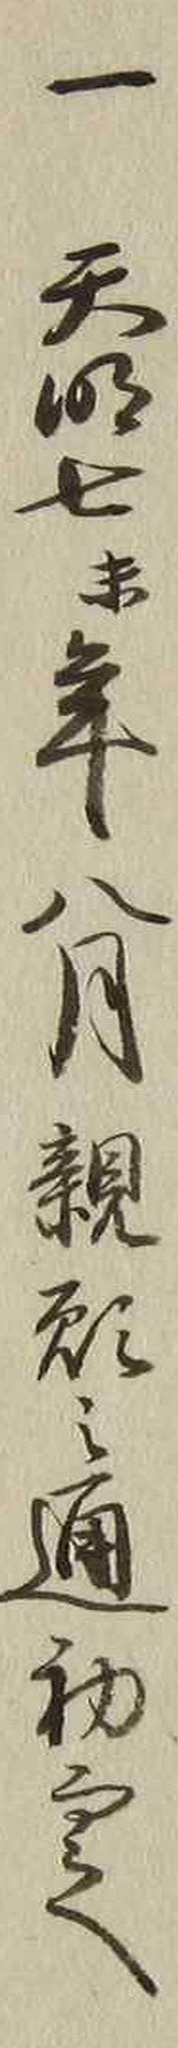一天明七未年八月親願之通初而之
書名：諸士系譜　巻之133　た之部9
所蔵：会津若松市立会津図書館
